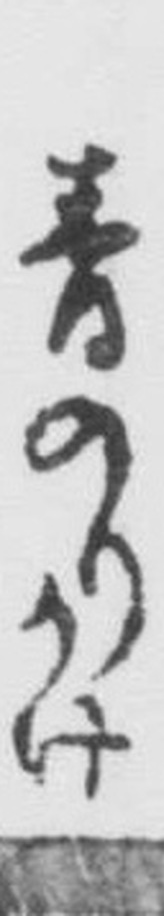青のりかけ

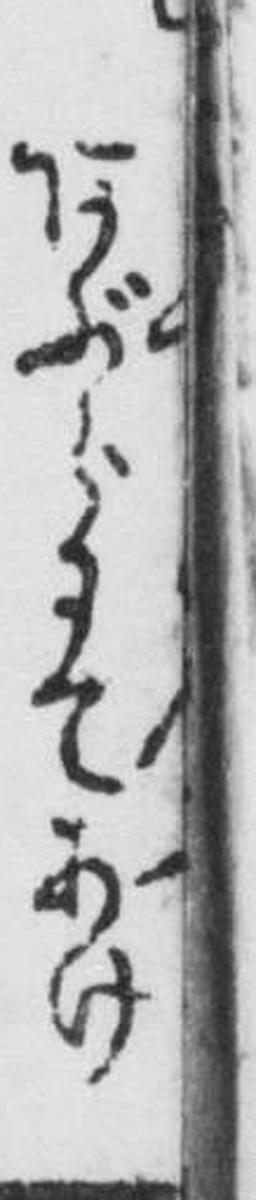あぶらにてあけ
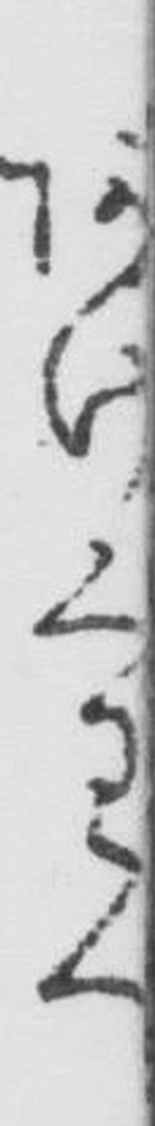あげくわへ
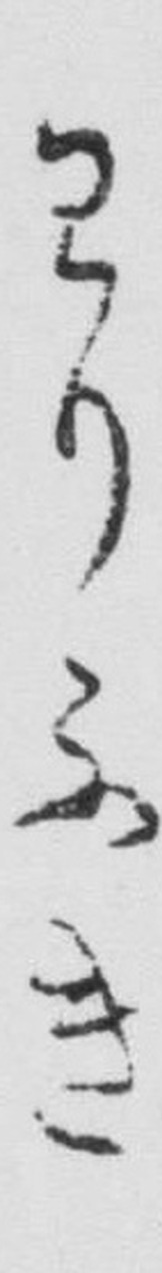わりふき
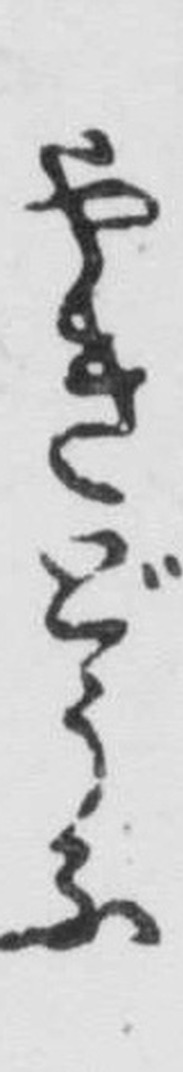やきどうふ
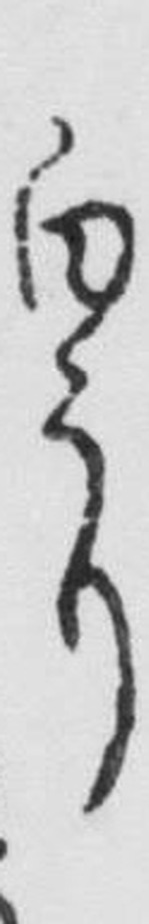白うり
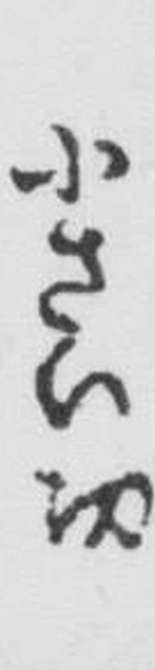小さい切
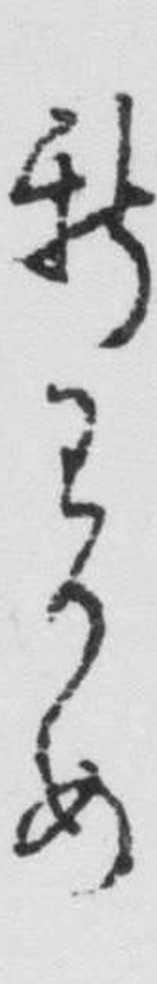新わかめ
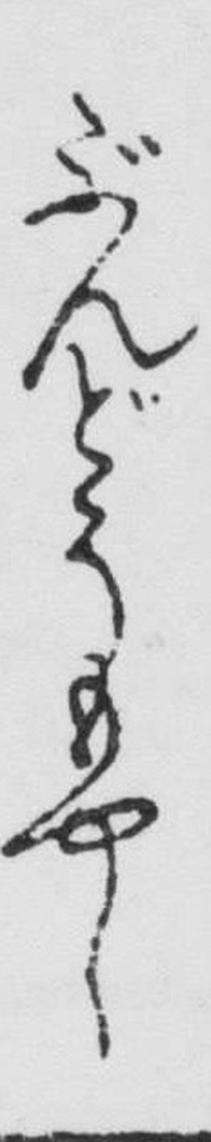ぶんどうもやし
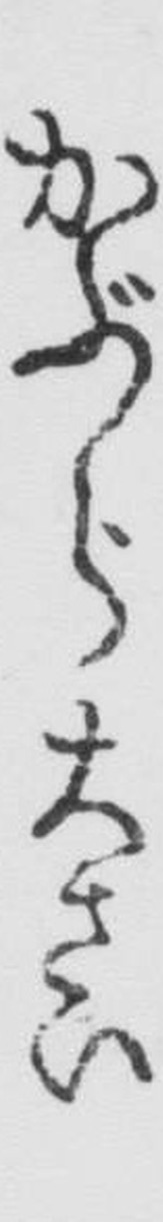かぶら大さい
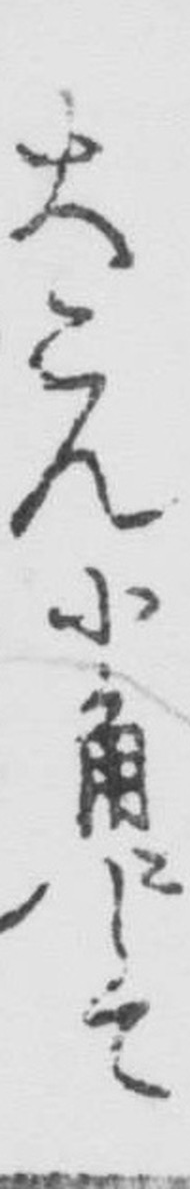大こん小角にして
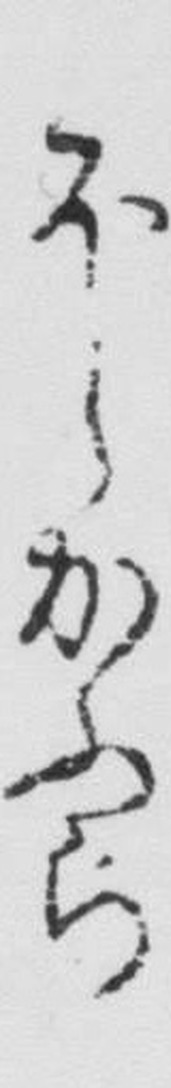ほしかふら
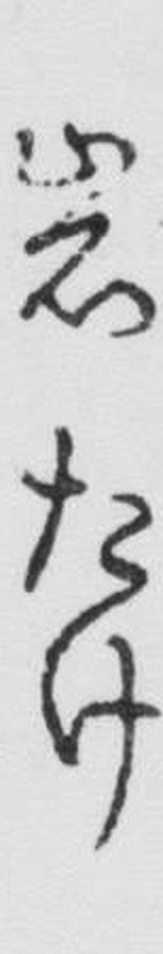岩たけ
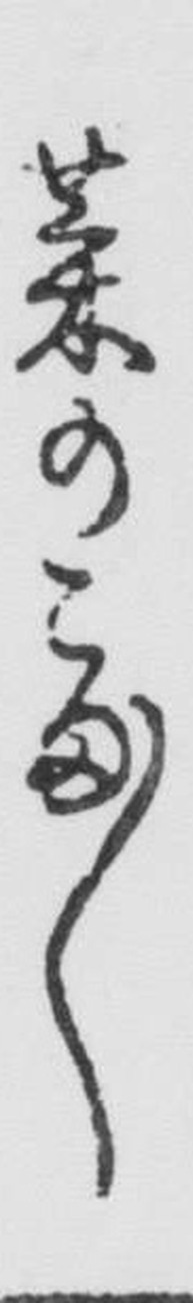菜のこま〳〵
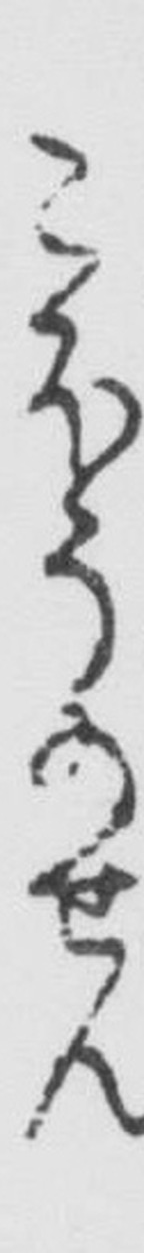こほうのせん
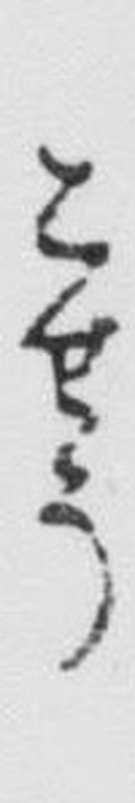こせう
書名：諸家通用/即席料理
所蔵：大阪府立大学学術情報センター 国文学研究資料館
